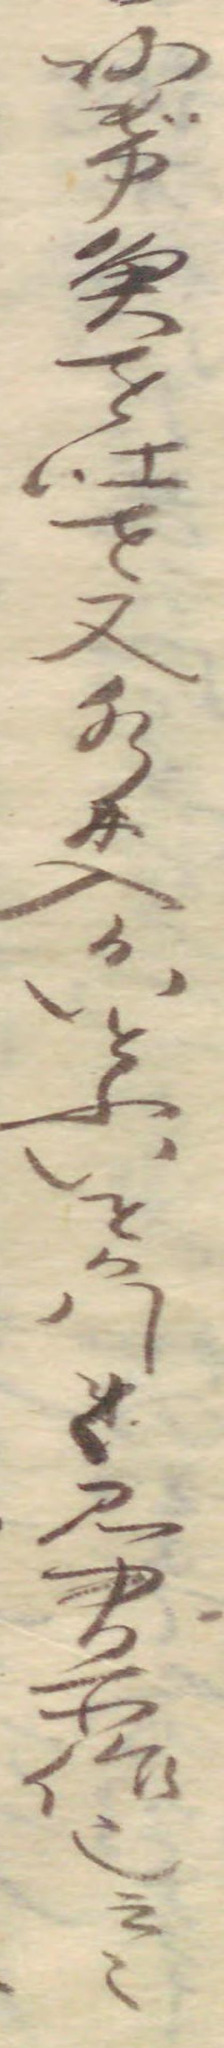あげ魚を吐せ又水に入るいとふいそかはしく見ゆる所作也云〻
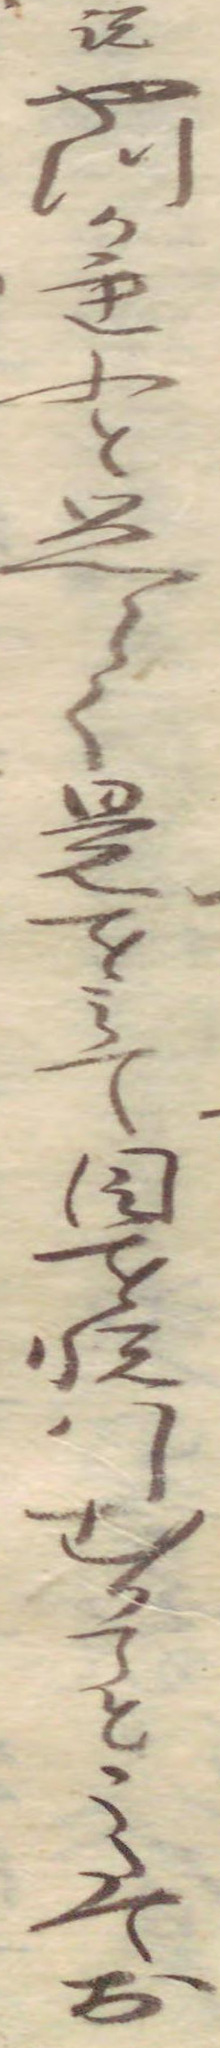やつかれふと思へらく是をみて目を悦はしむるこそうたてお
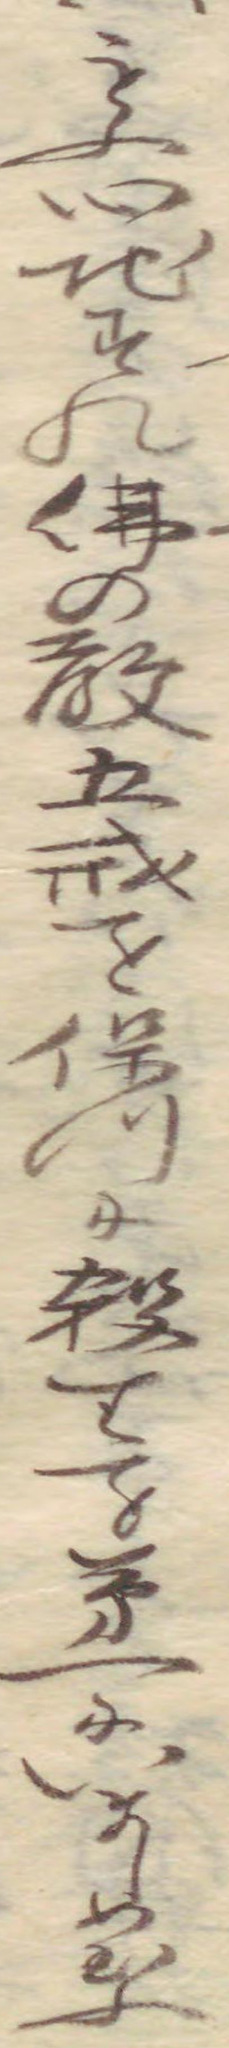もふ心地すれ仏の教五戒を保つに殺生を？第一にいましめ玉ふ
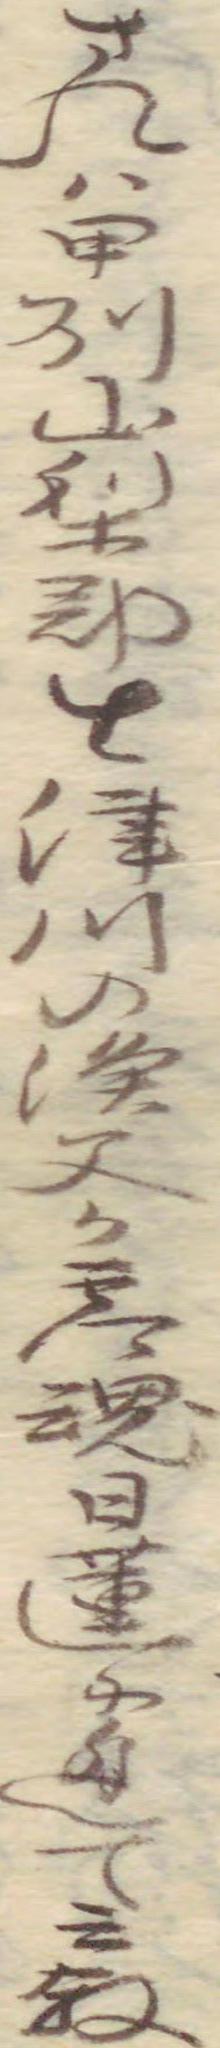されは甲州山梨郡生津川の漁父か霊魂日蓮に逢て云殺
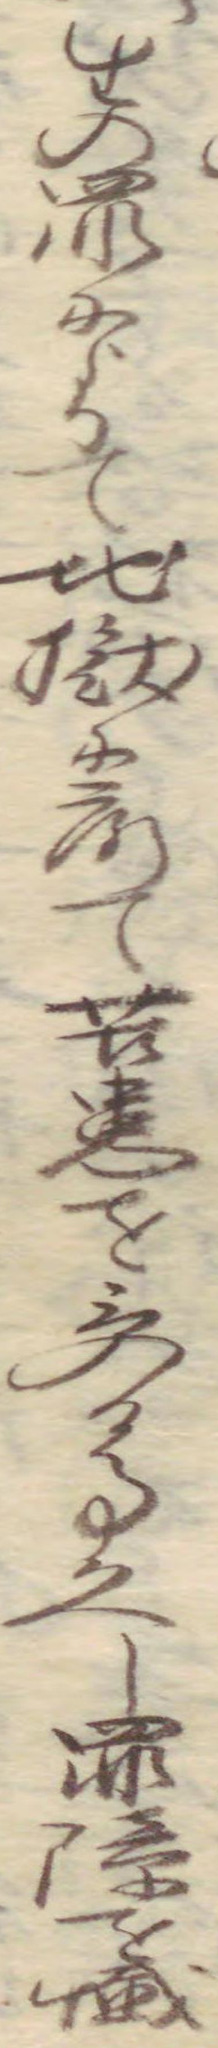生の罪によりて地獄に落て苦患を受る事久し罪障を懺
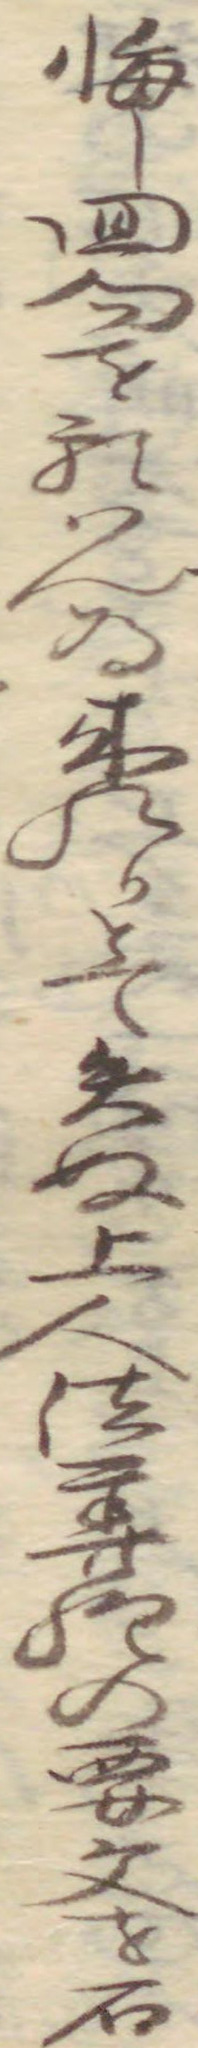悔し回向を願はん為来れりとて告ぬ上人法華経の要文を石
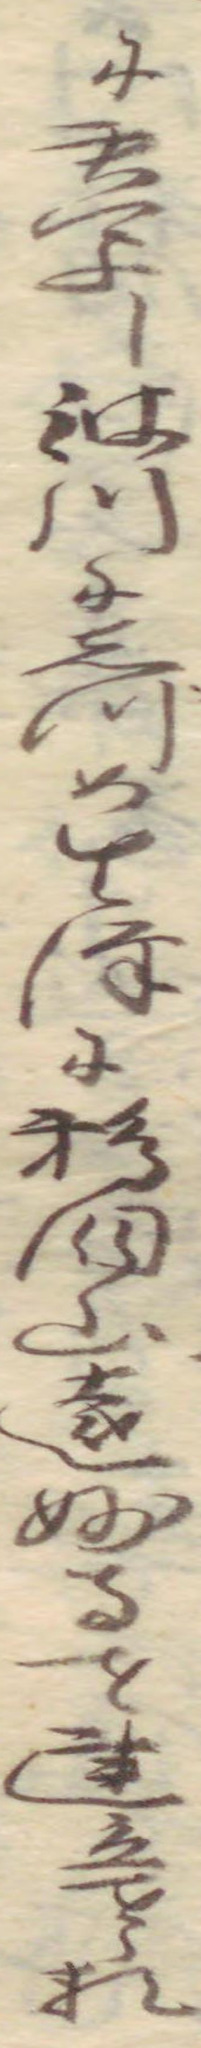に書写し彼川にしづめ生津に鵜飼山遠妙寺を建立せらる
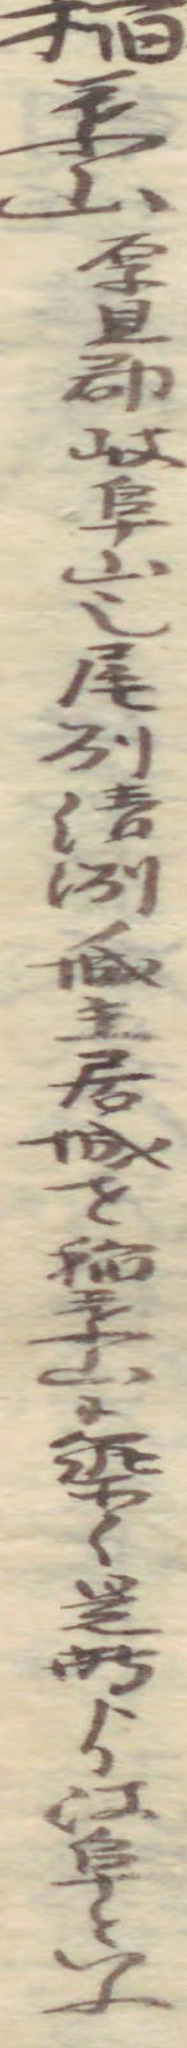稲葉山厚見郡岐阜山也尾州清洲ノ城主居城を稲葉山に築く是時より岐阜といふ
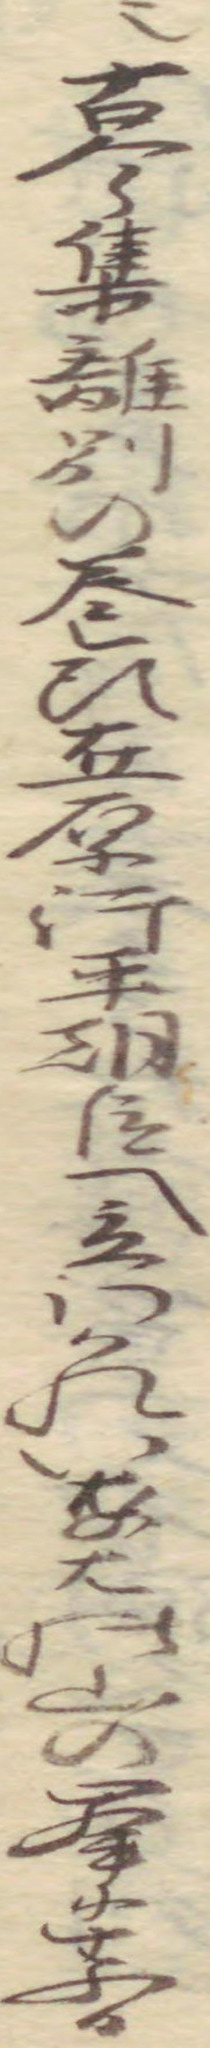古今集離別の巻頭在原行平朝臣〽立わかれいなはの山の峰に生ふる
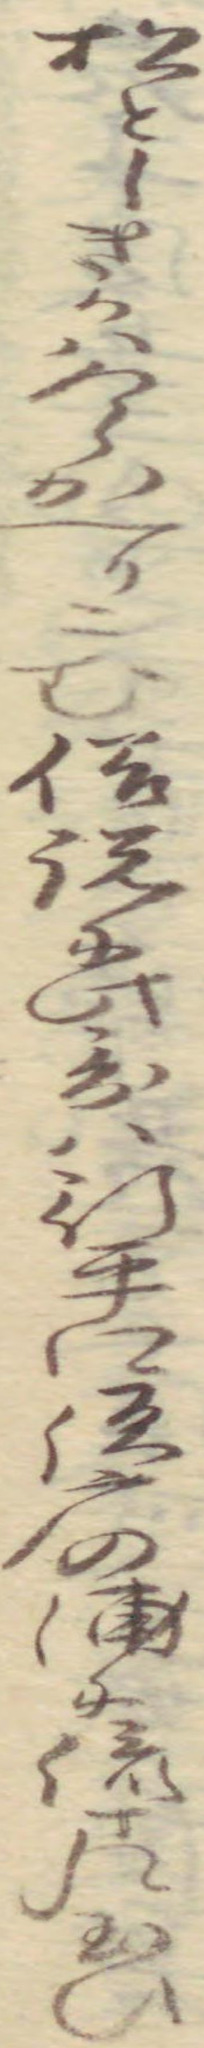松としきかは今かへりこむ俗説に此歌は行平卿須磨の浦に流され玉ひ
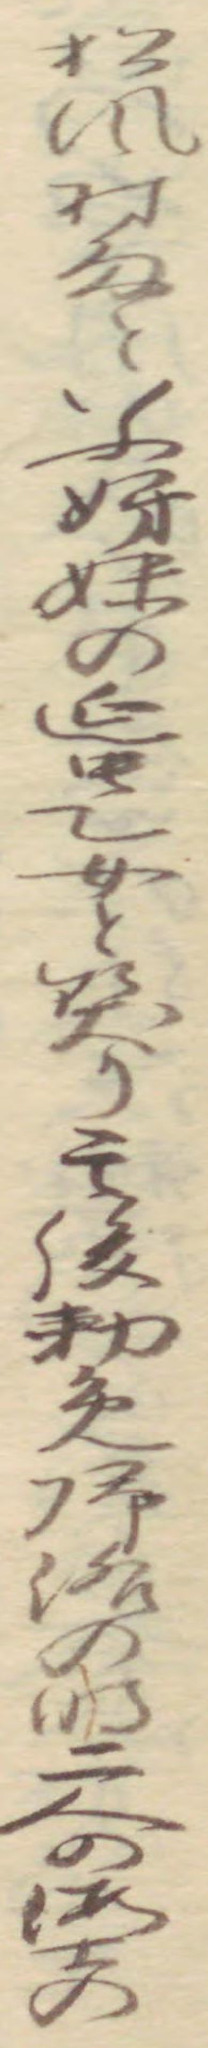松風村雨といふ姉妹の蜑乙女と契り其後勅免帰洛の時二人の海士の
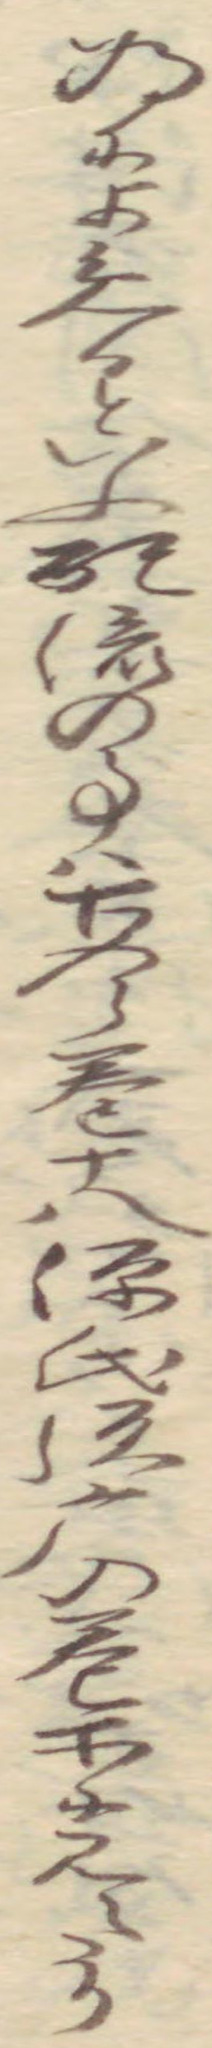為によめるといふ配流の事は古今巻十八源氏須磨の巻等に見えたり
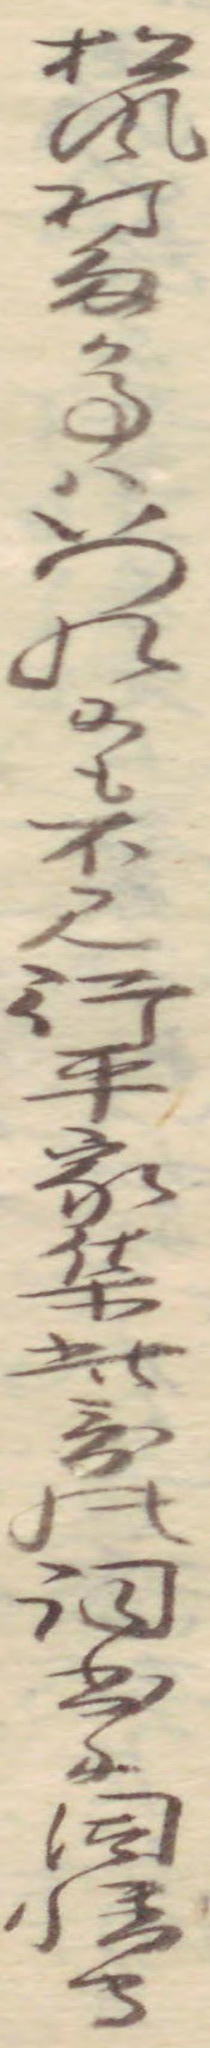松風村雨か事はいつれにも不見行平家集此歌の詞書に因幡寺
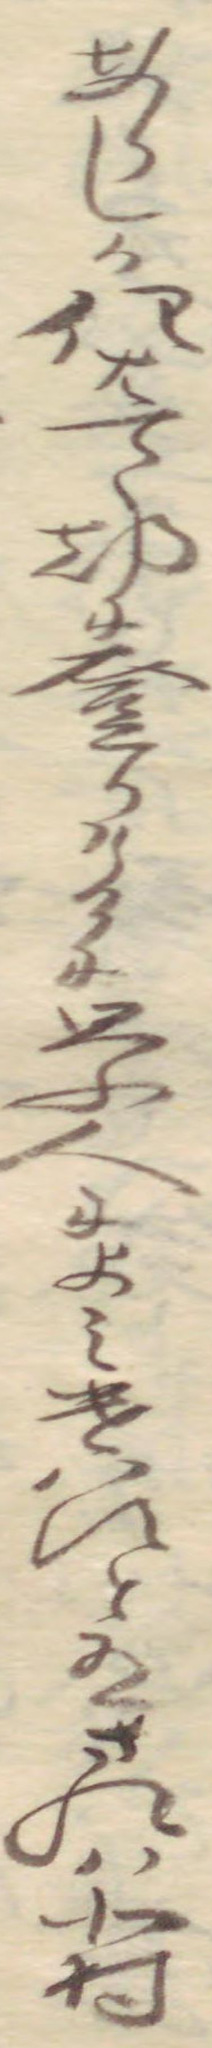なりしか任はてゝ都に登りけるに思ふ人によみ遣はすと有されは北村
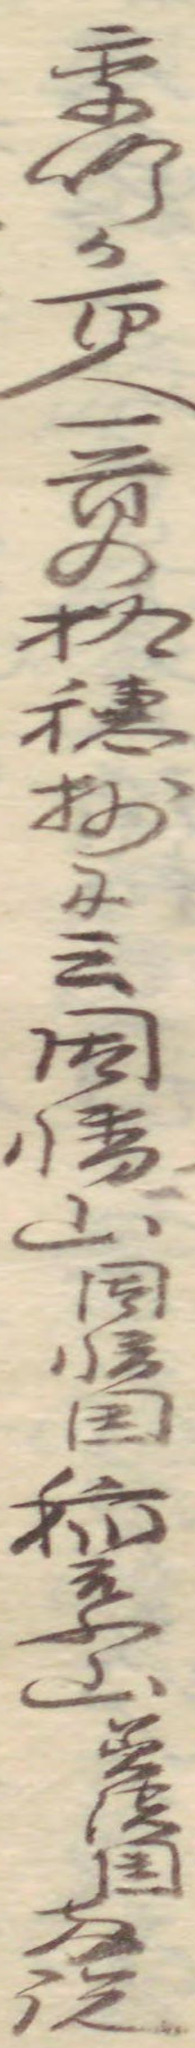季吟か百人一首の拾穂抄に云因幡山因幡国稲葉山美濃国両説
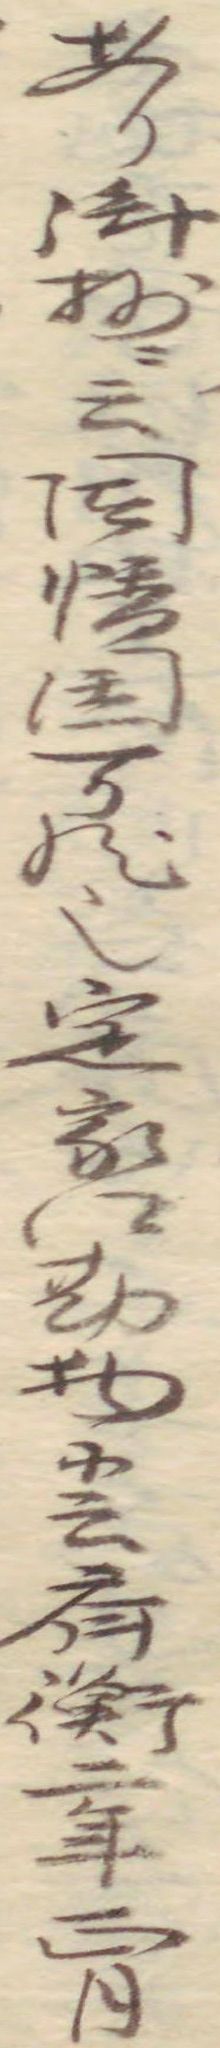あり御抄ニ云因幡国可然也定家卿勘物に云斉衡二年正月
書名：鶯宿雑記. 巻263-264
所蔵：国立国会図書館 National Diet Library, JAPAN
